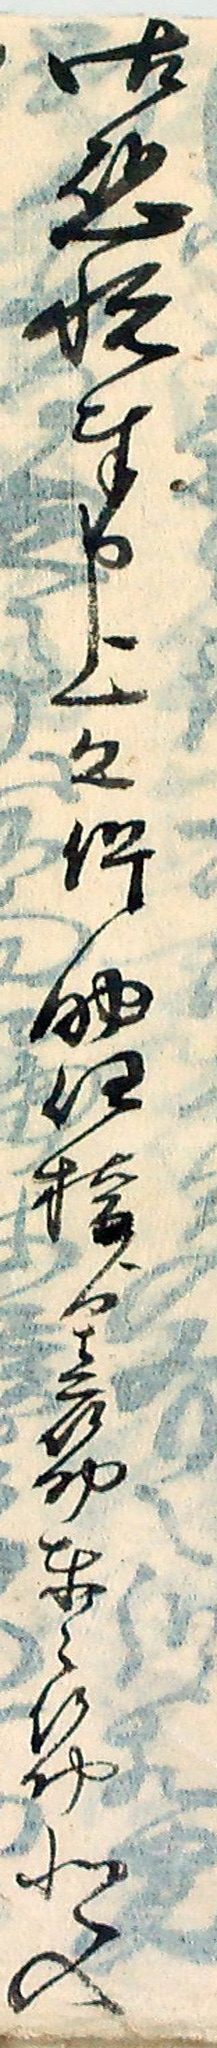御恐悦奉申上候但し助任橋ゟ壱筋東之筋北へ入
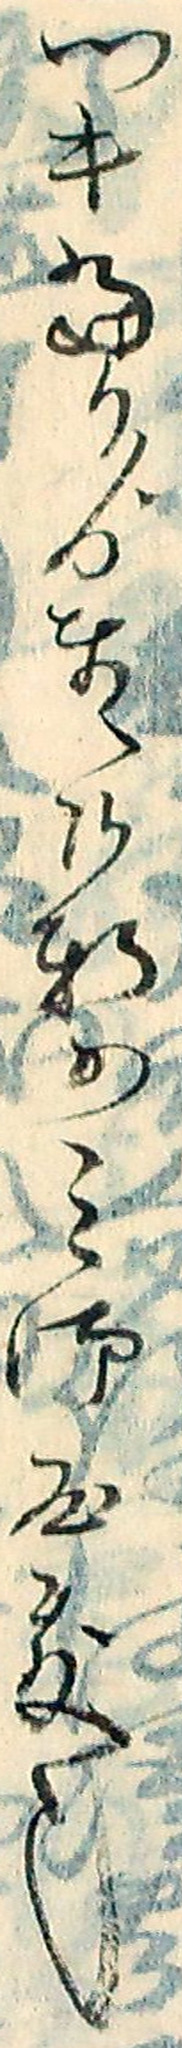つき当りゟ東へ弐軒め之御屋敷也

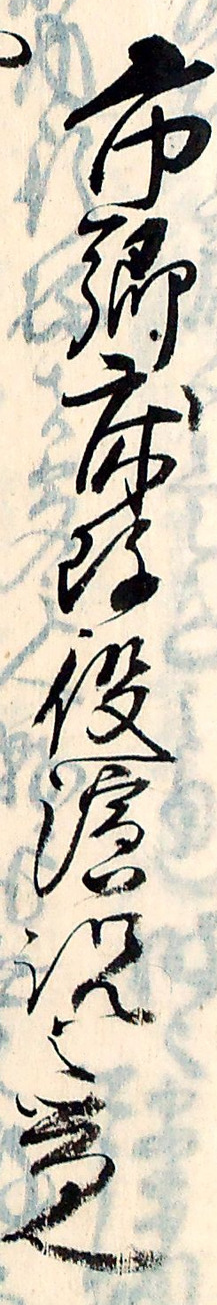市郷床改役演説之覚
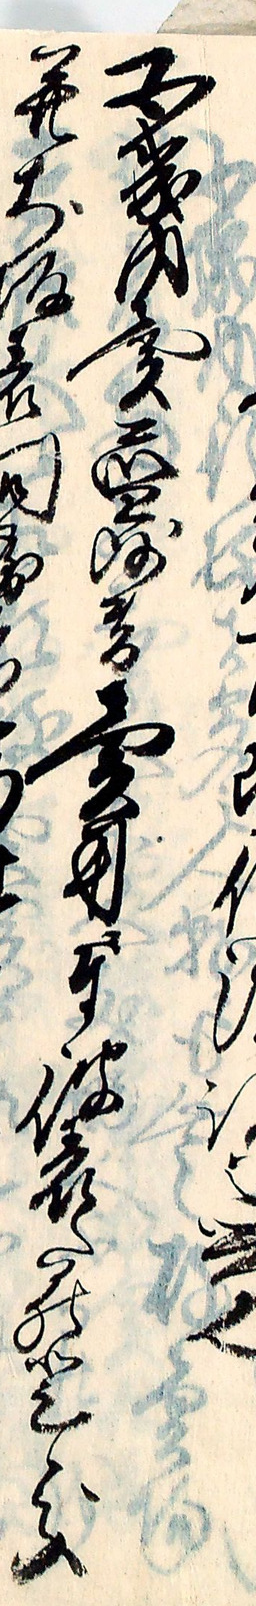五畿内売藍師共売用に付彼表へ罷登候義
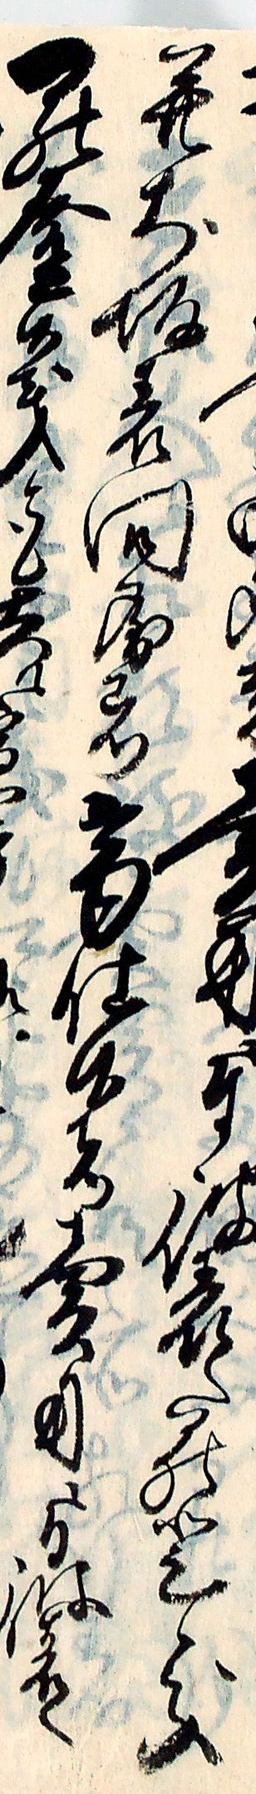并大坂表問屋着商仕候者売用に付彼表へ
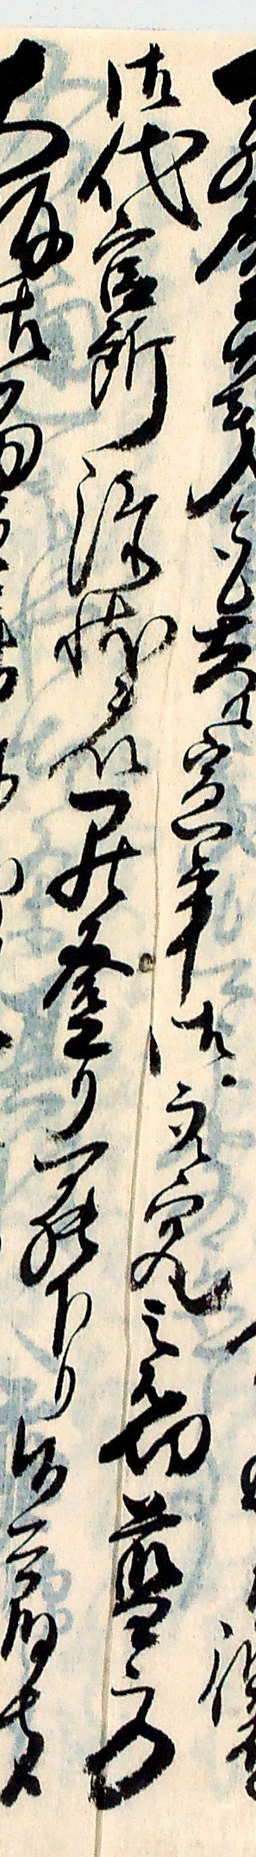御代官所添状を以罷登り罷下り候節は
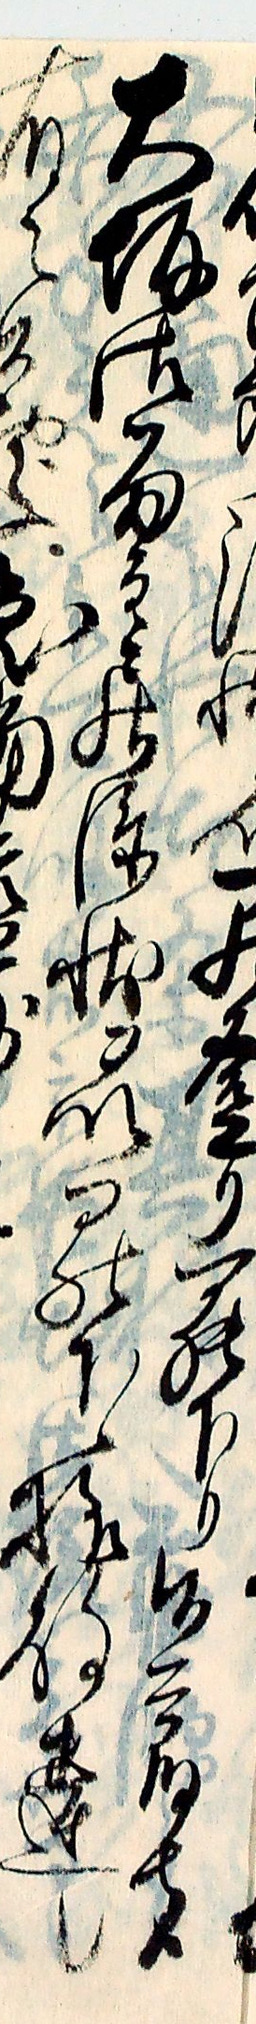大坂御留主居添状を以罷下候様触達し
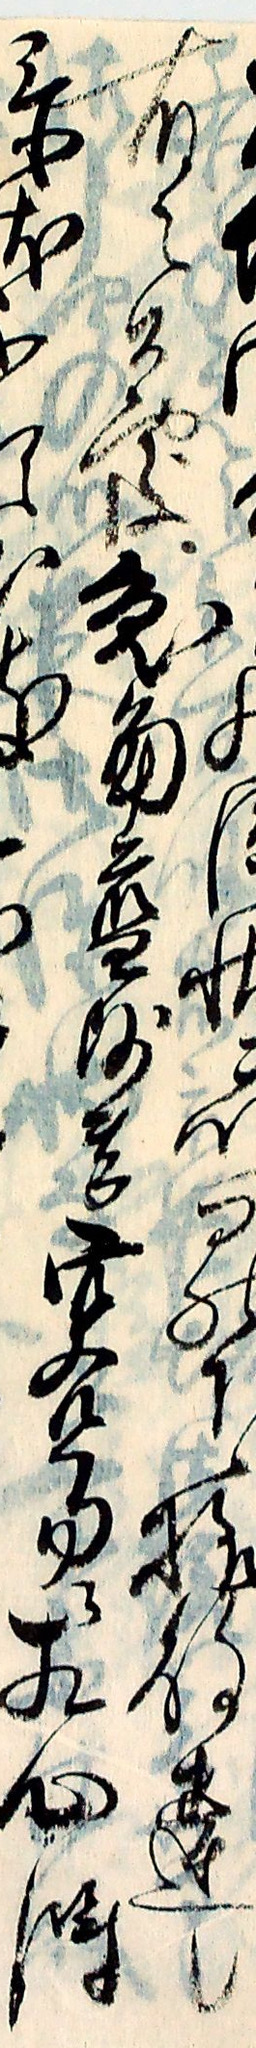有之候処兎角藍師共容易に相心得
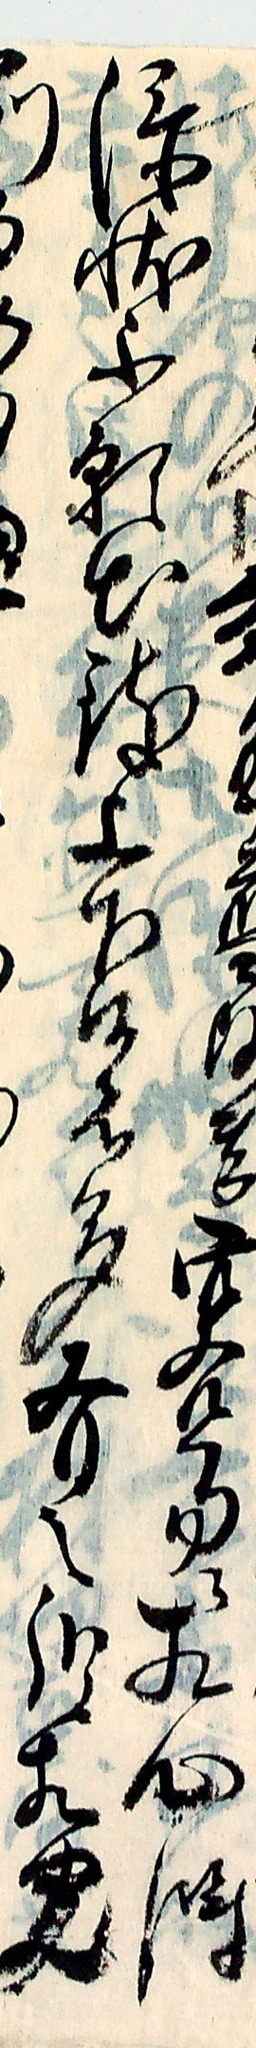添状不願出致上下候者多有之哉に相見
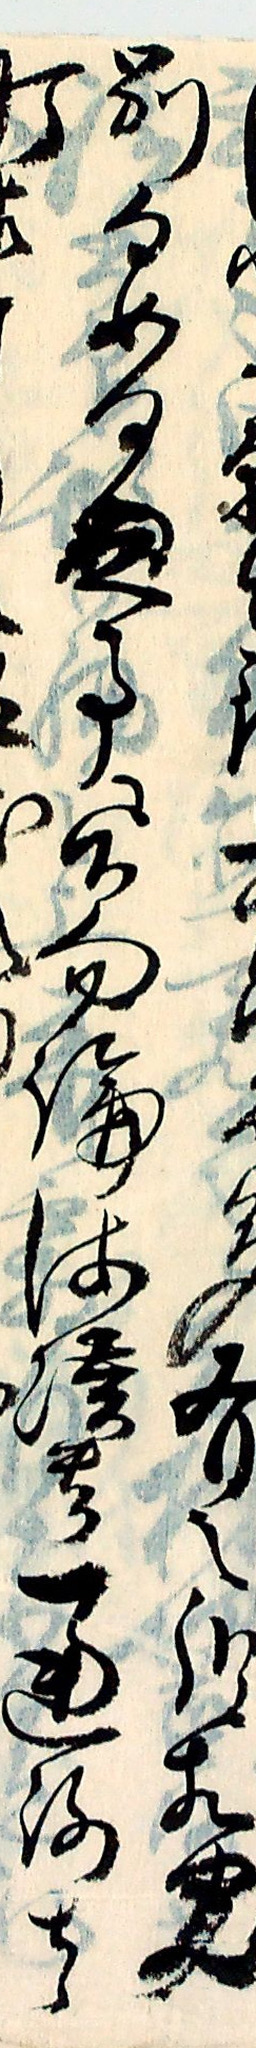別て如何之事に候勿論海陸共通路は
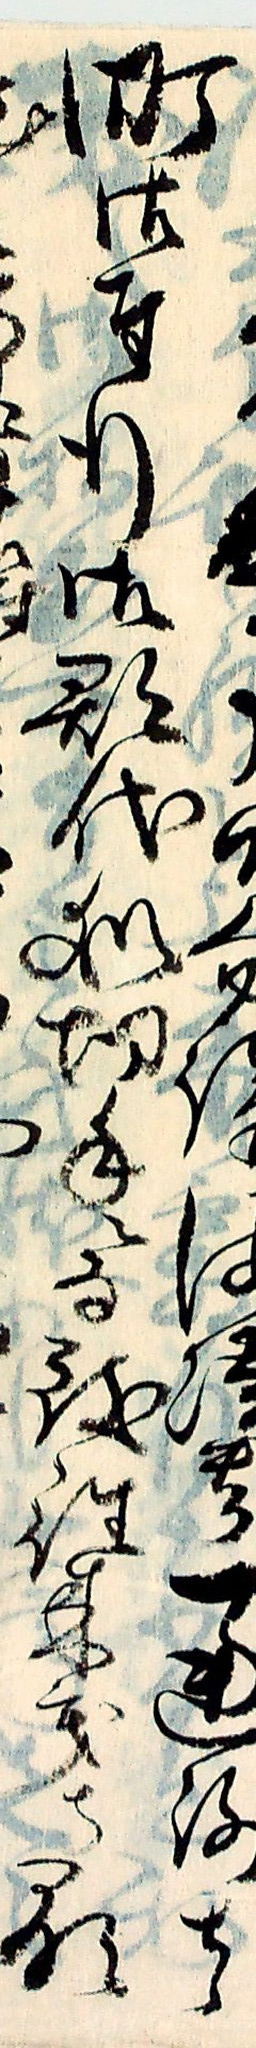町御奉行御郡代処切手にて致往来義は顕
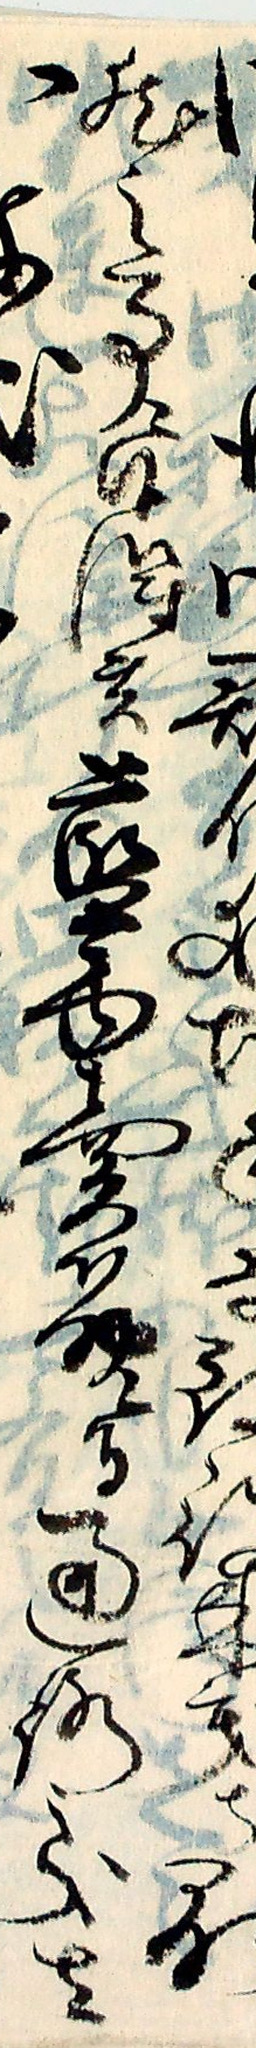然之事に候得共藍商売筋に付通路之義は
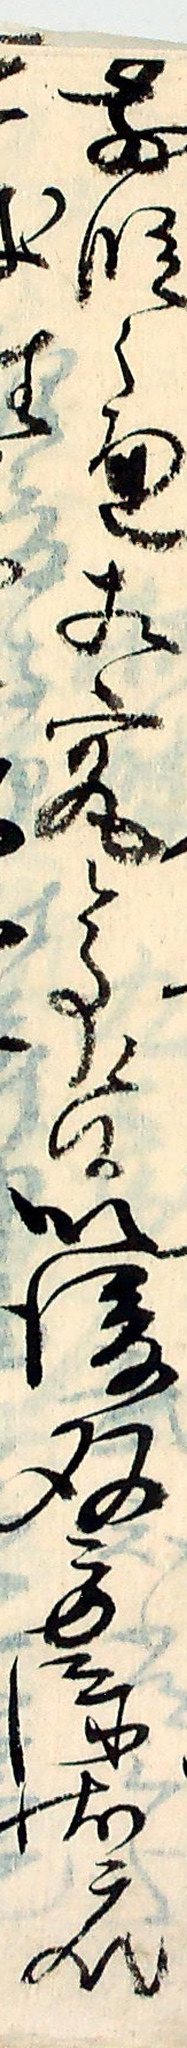前段之通相究候事に候以後双方添状を以
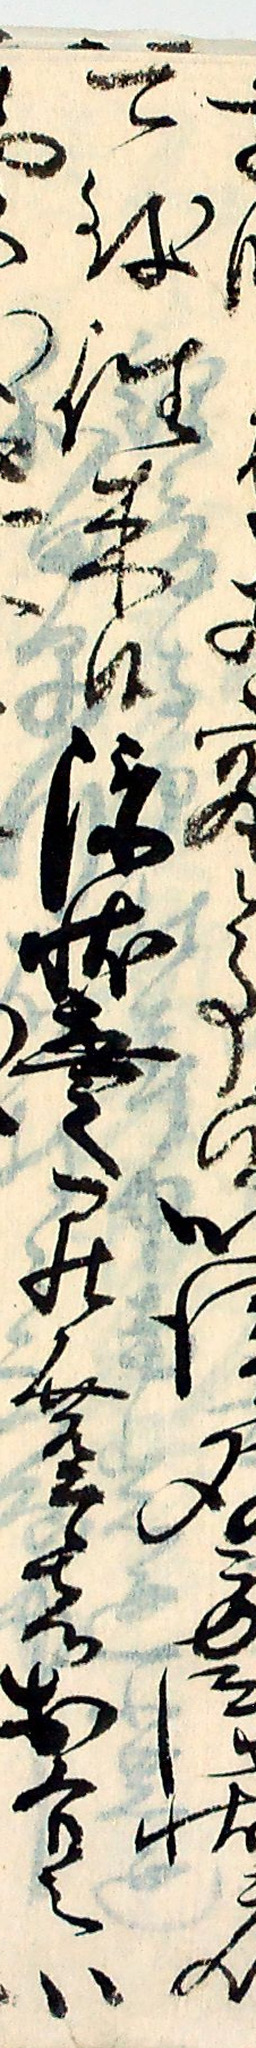可致往来候添状無之罷登候者於有之は
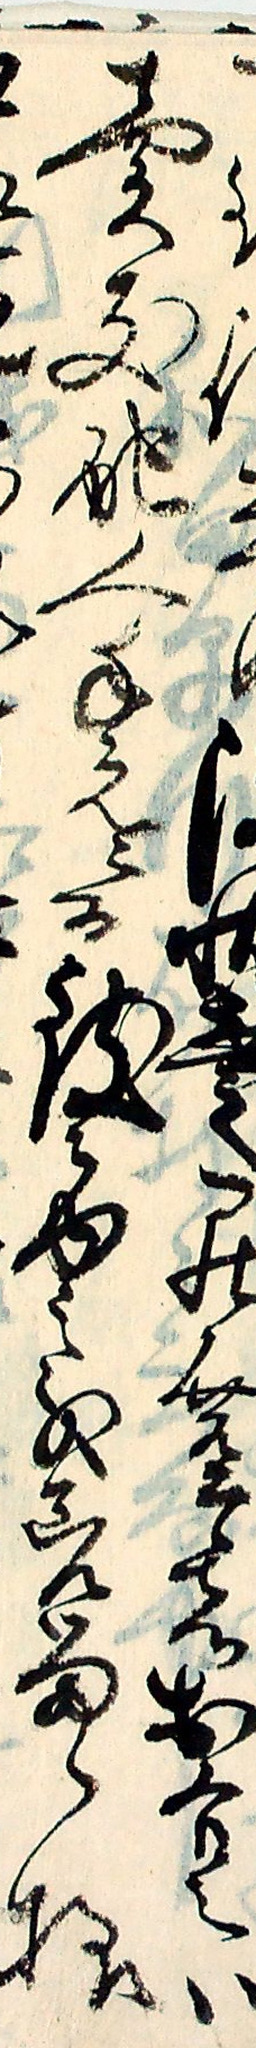売支配人手元に而致商之義差留候様
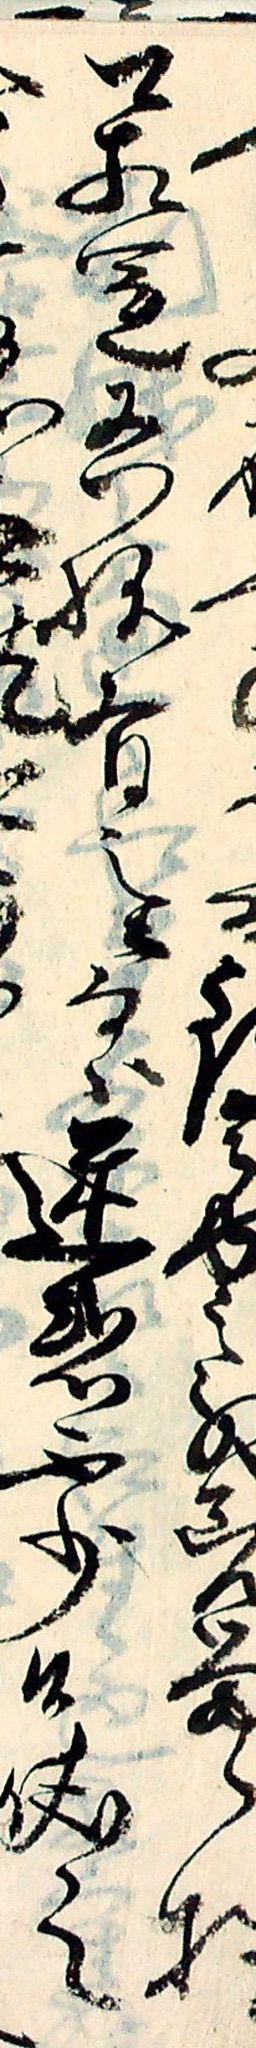可相運右様有之にては迷惑不少候依之
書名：諸御願書控(後藤氏壱番）
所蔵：鳴門教育大学 Naruto University of Education
